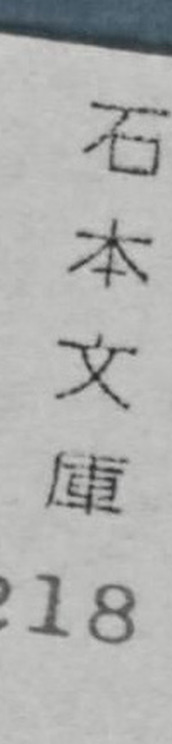石本文庫

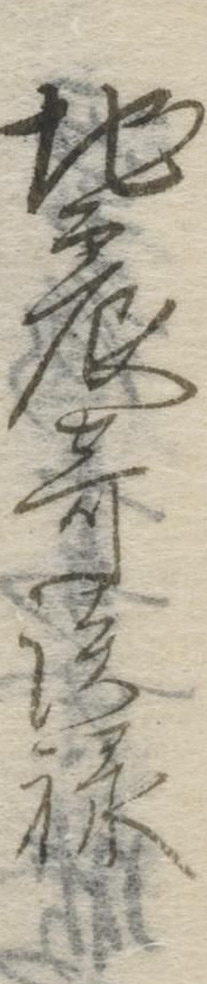地震奇談禄
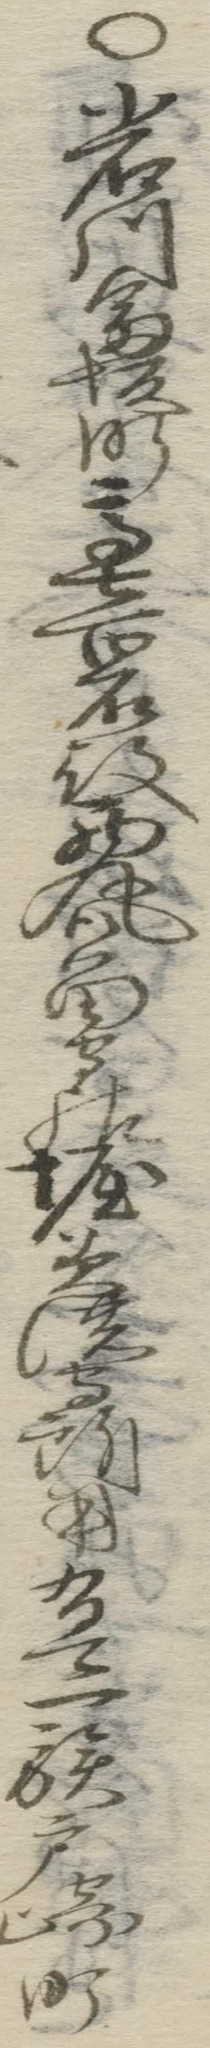○小石川富坂町髙七百石役西丸御留守居堀美濃守所用有て一族戸崎町
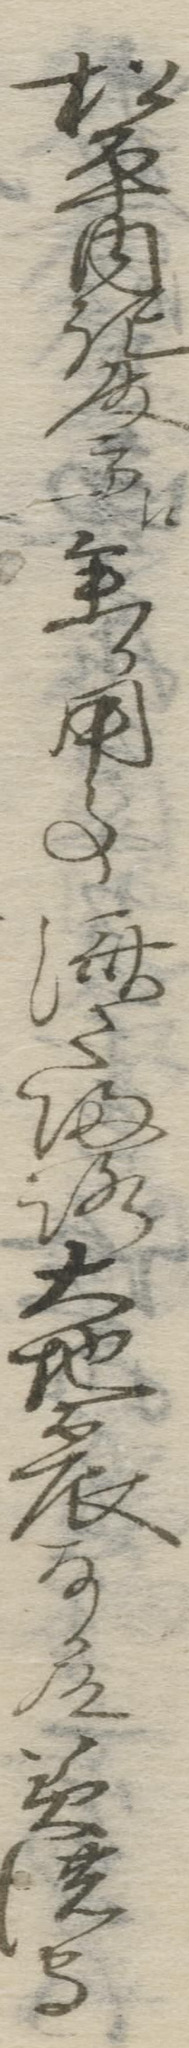松平内記殿方江参り用事済て帰路大地震なる故美濃守
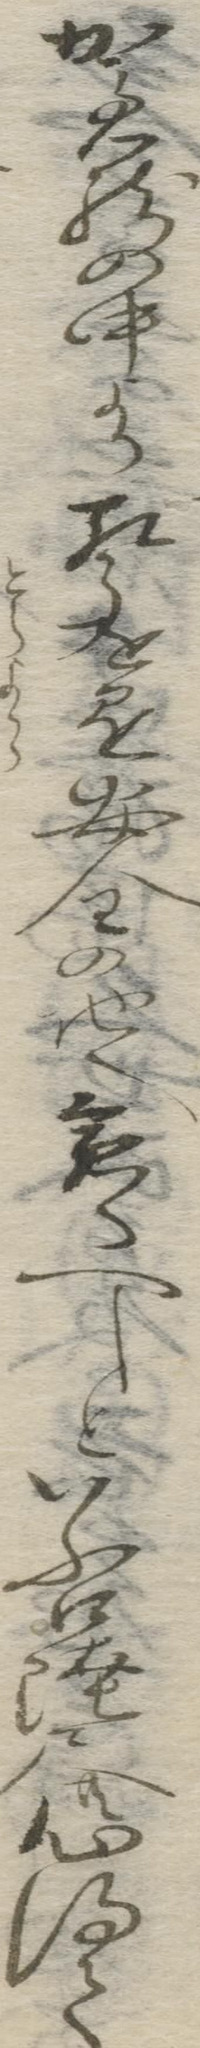駕籠の中より声を懸安全の地へ急くへしといふ御陸尺共心得て
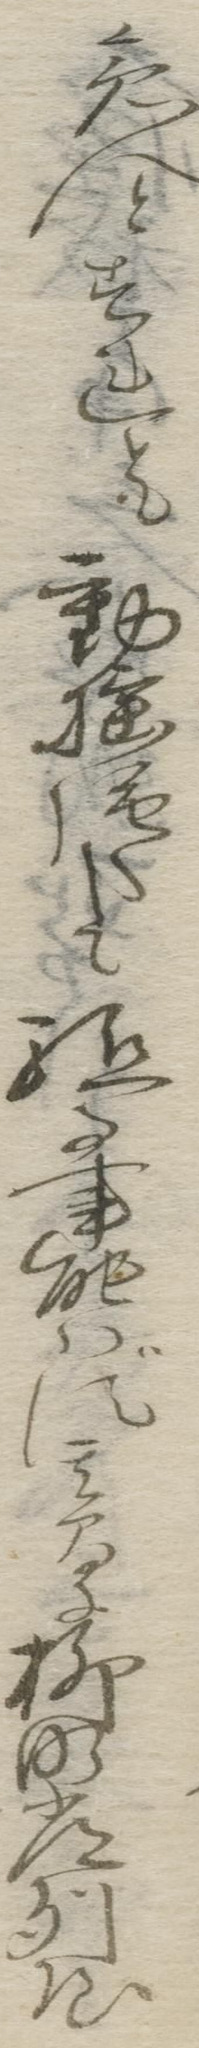急んとすれとも動揺強くして駆る事能はず其間に柳町常州屋
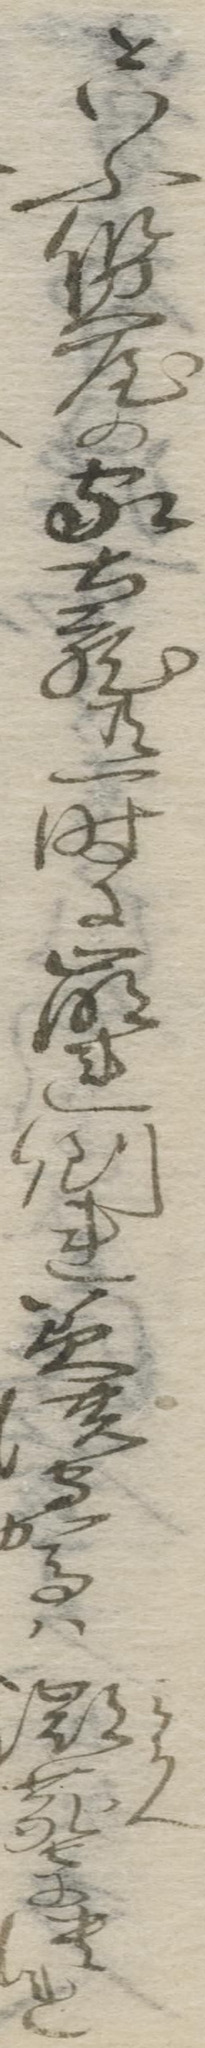といふ質屋の家土蔵共一時に崩れ倒れ美濃守駕は微塵に潰れ
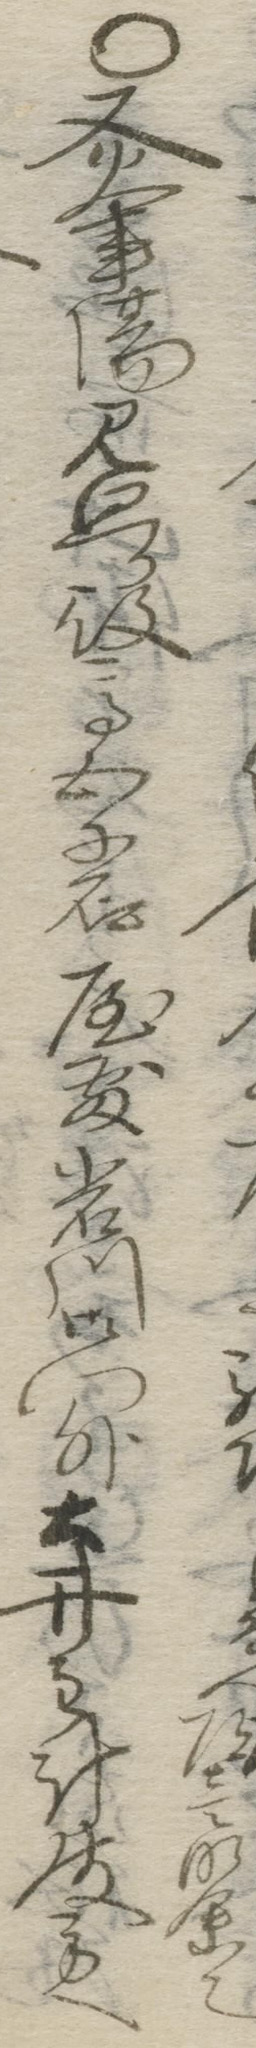○又火事場見廻役高五千石屋敷小石川御門外土井主計殿方へ
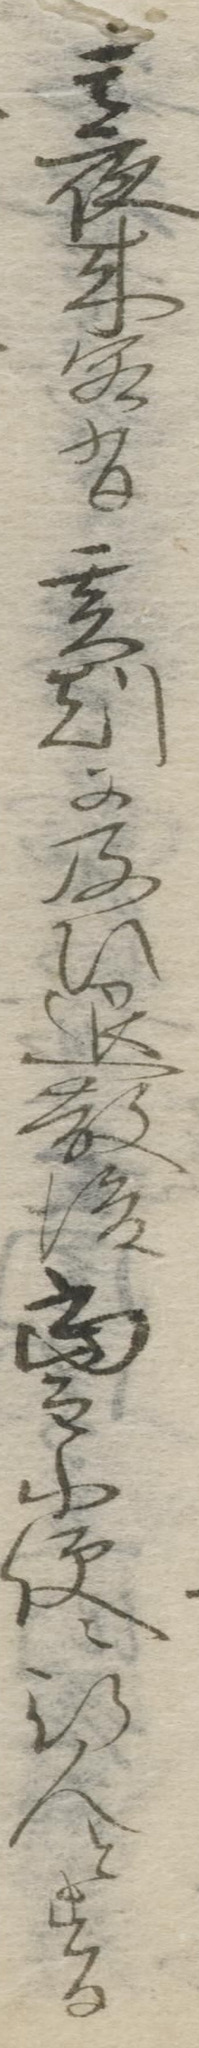其夜来客有亥刻に及ひ退散後当主小便に行んとする
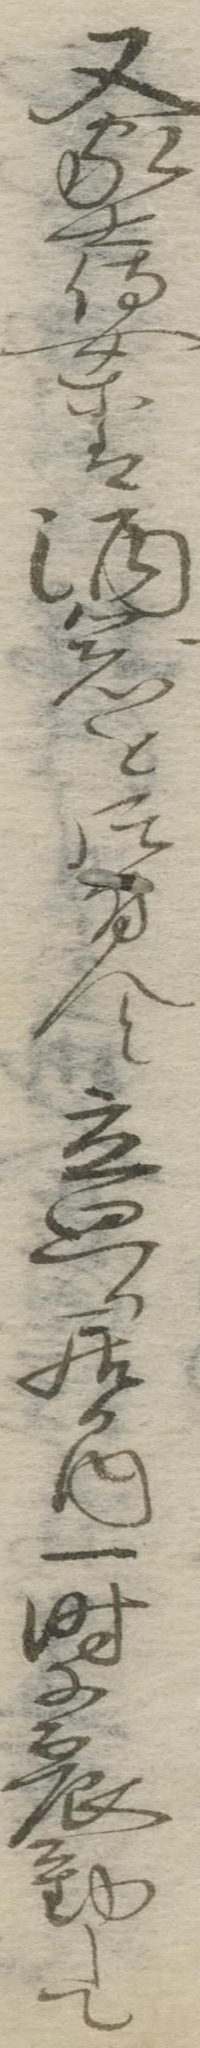又家士侍女等は酒箸を片付んと立廻り居る内一時に震動して

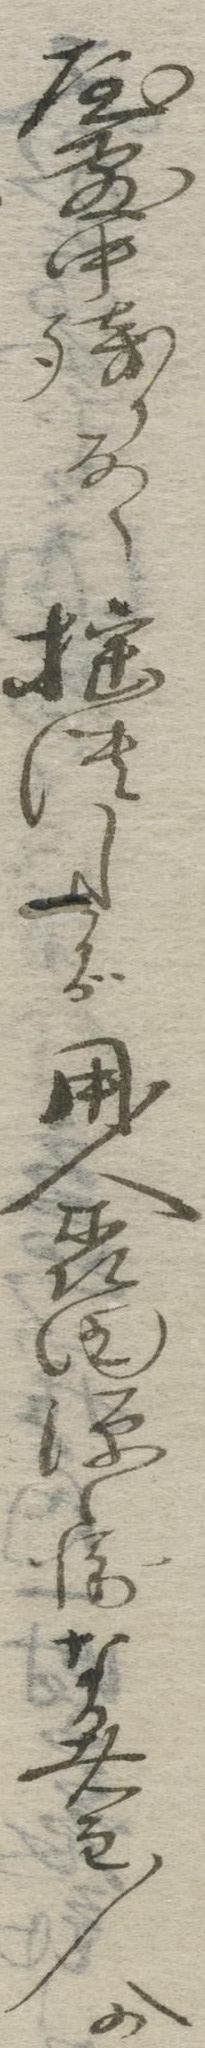屋敷中残りなく揺潰したるが用人森田源兵衛なる者主人の
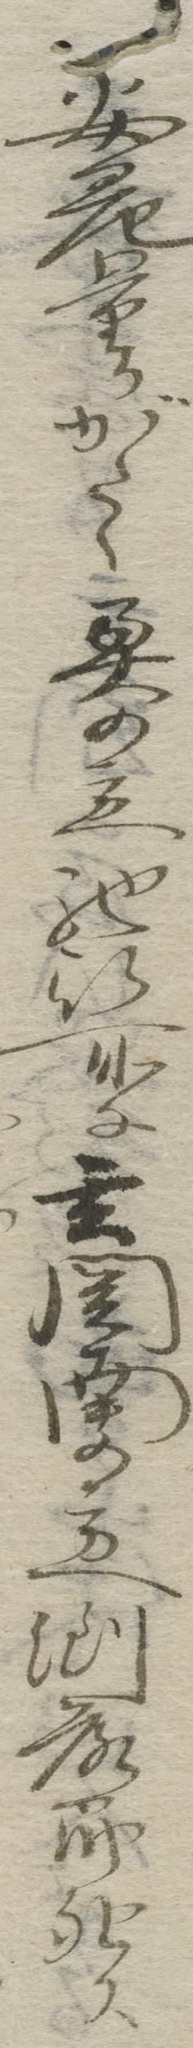安危量りがたく奥の方へ馳行所に玄関南の方へ倒落即死ス
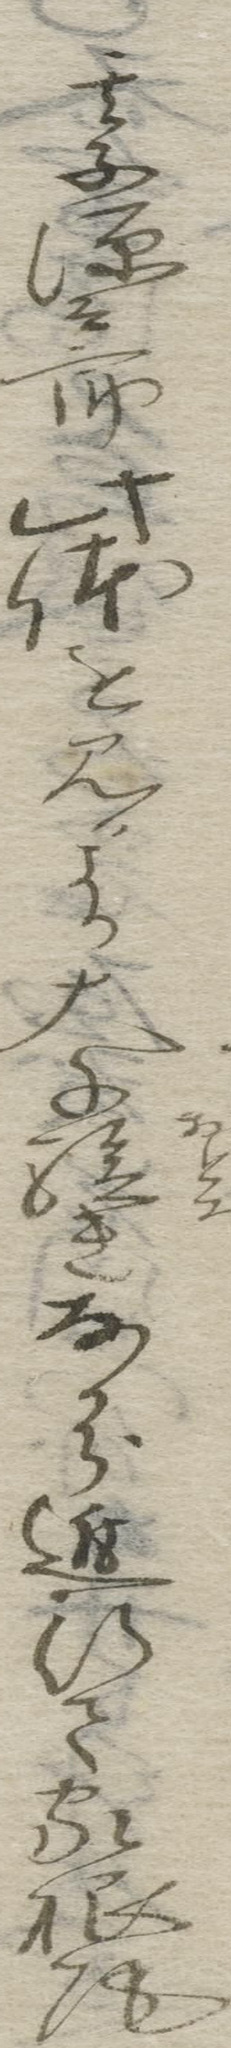其子源太郎此体を見るより大に駭きなから進行て家根瓦
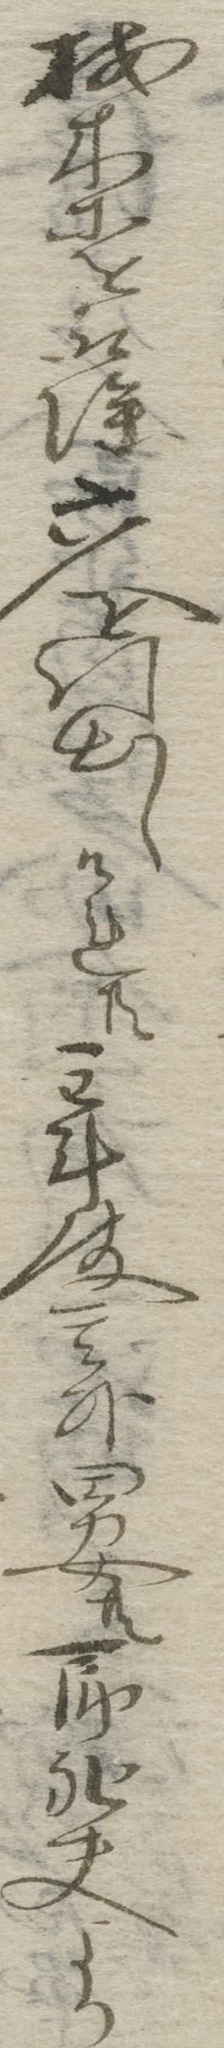材木等を取除六人を引出しけれ共主計殿其外男女共即死夫より
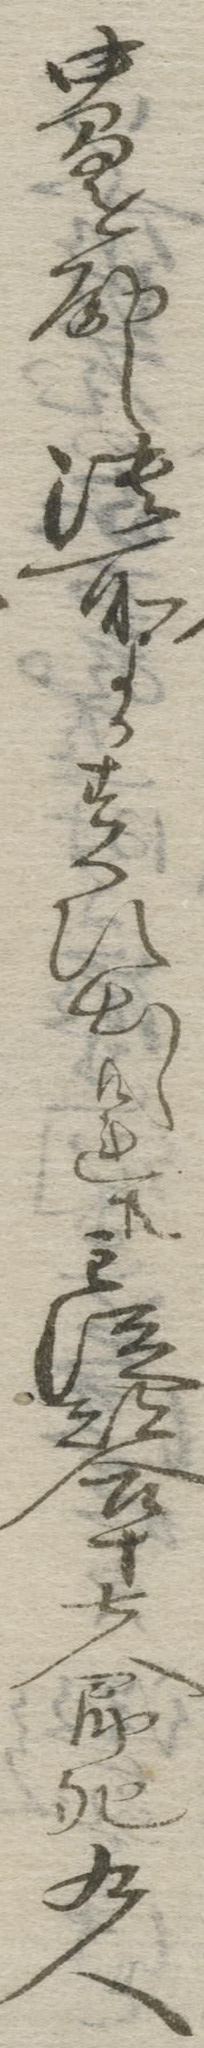中間を励し潰所よりすくひ出しけれ共主従都合十七人即死九人
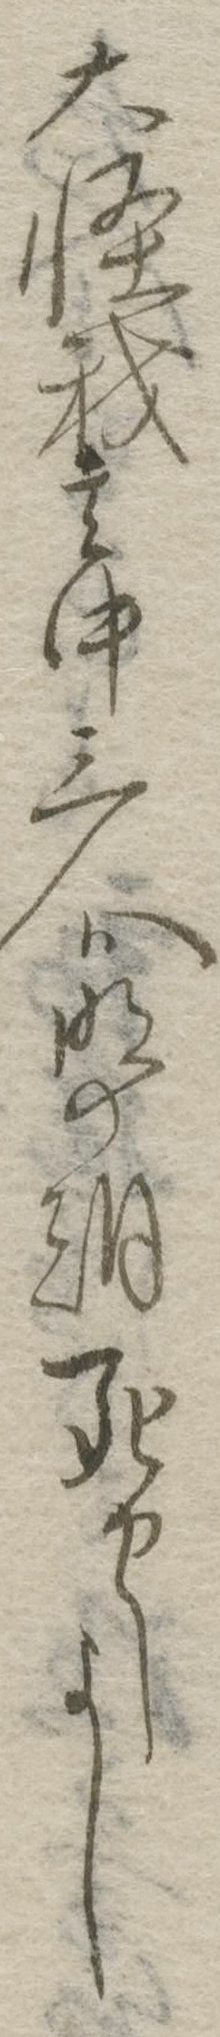大怪我其中三人ハ明の朝死せしよし
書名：江戸中諸屋敷　地震竒談録
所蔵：東京大学地震研究所図書室 Earthquake Research Institute Library, The University of Tokyo, JAPAN
